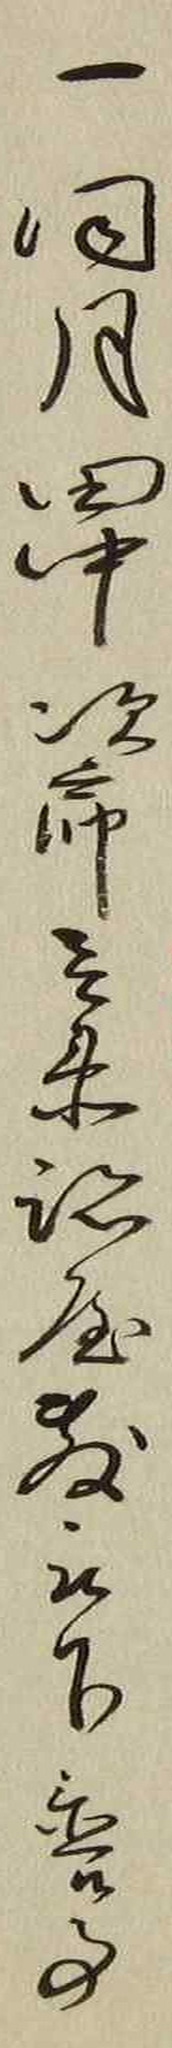一同月田中次郎兵衛跡屋敷被下置候事
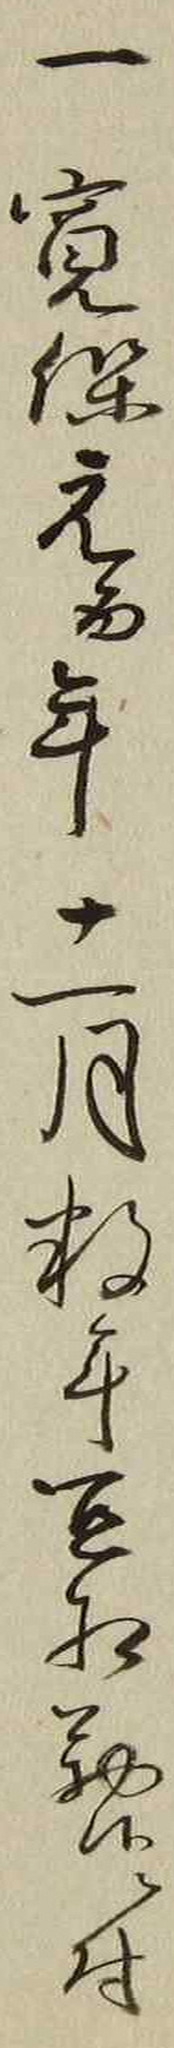一寛保元酉年十一月数年宜相勤候ニ付
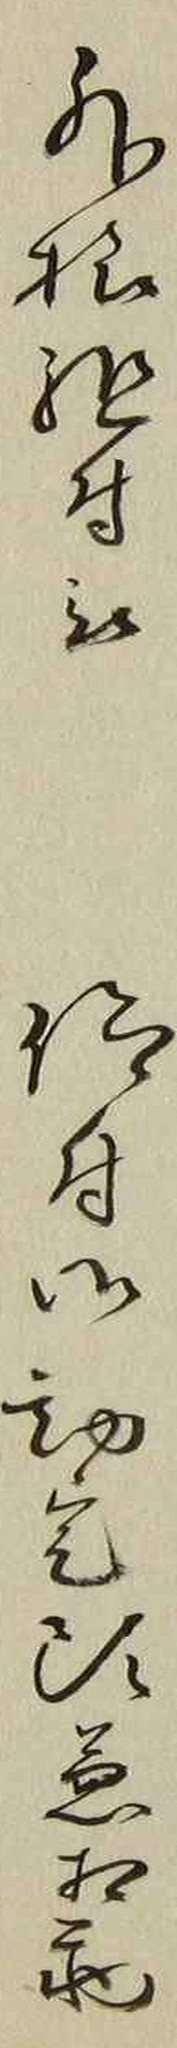外様組付被仰付御勘定頭兼相勤
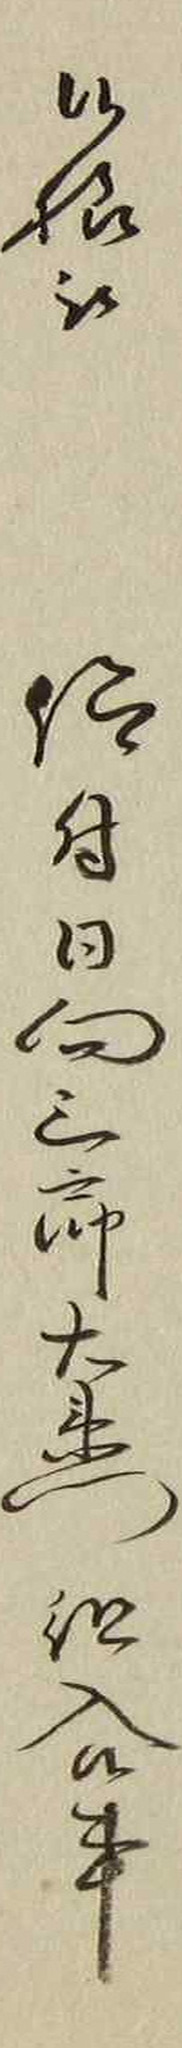候様被仰付日向三郎右衛門組入候事
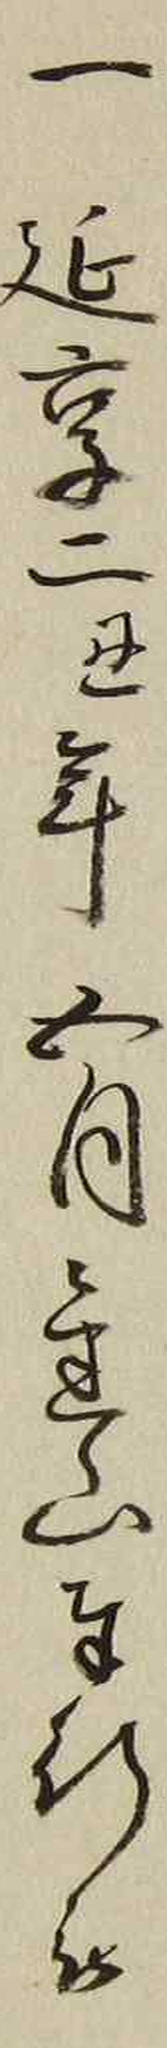一延享二丑年五月金山奉行被
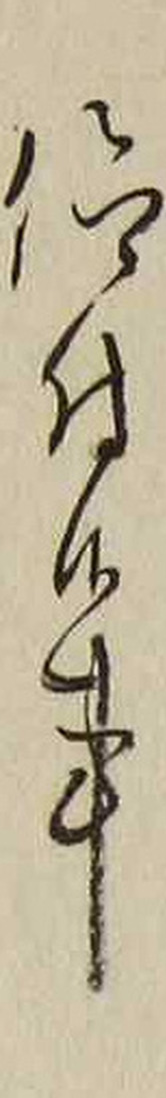仰付候事

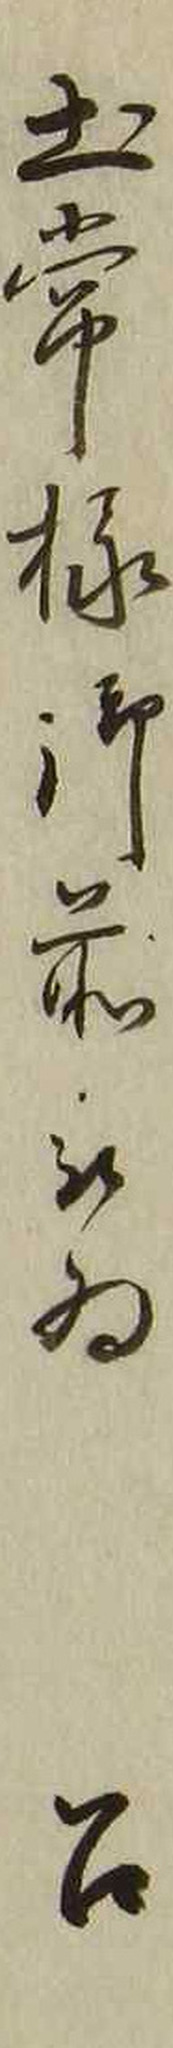土常様御前被為召
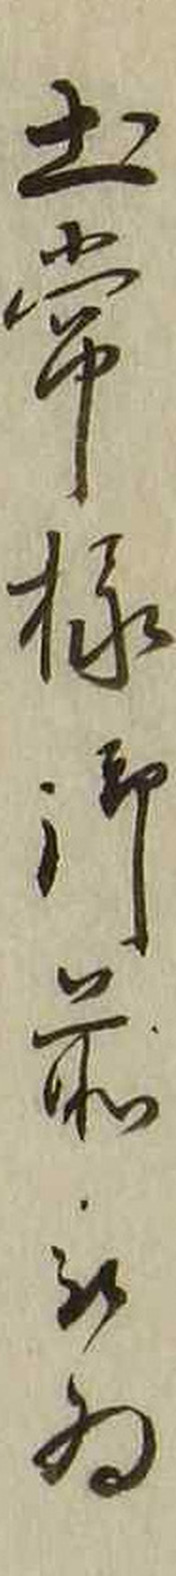土常様御前被為召
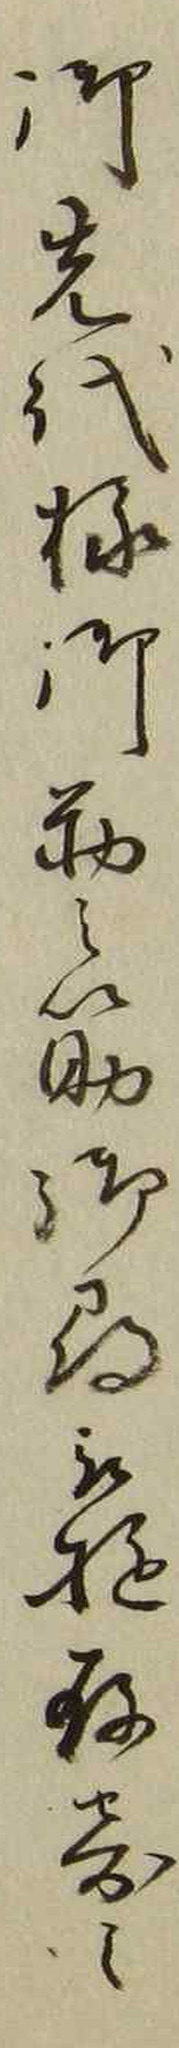御先代様御勤之筋御尋被遊存寄之
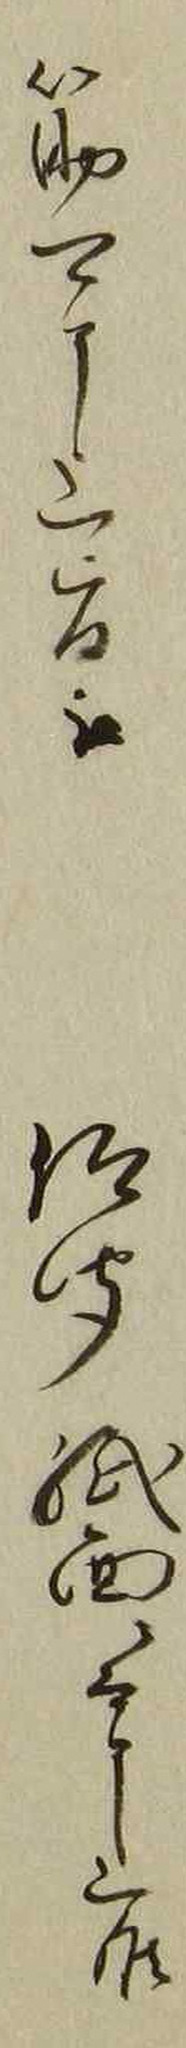筋可申上旨被仰聞紙面ニ而申上候
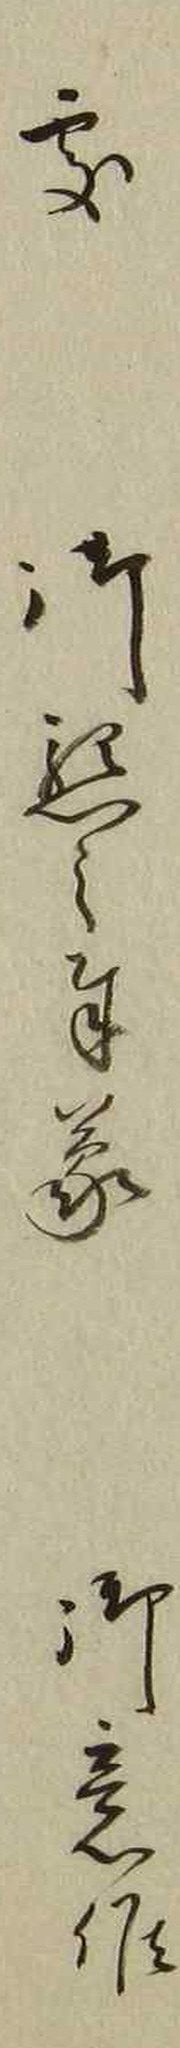処御懇之奉蒙御意候
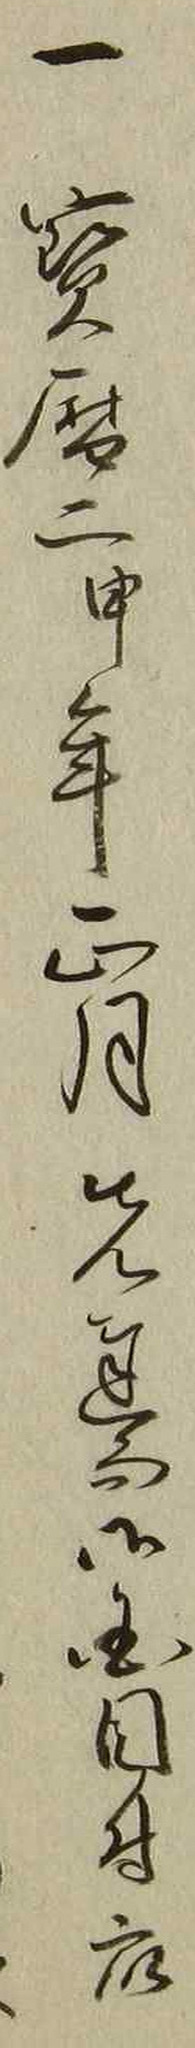一宝暦二申年正月先達而御国目付衆
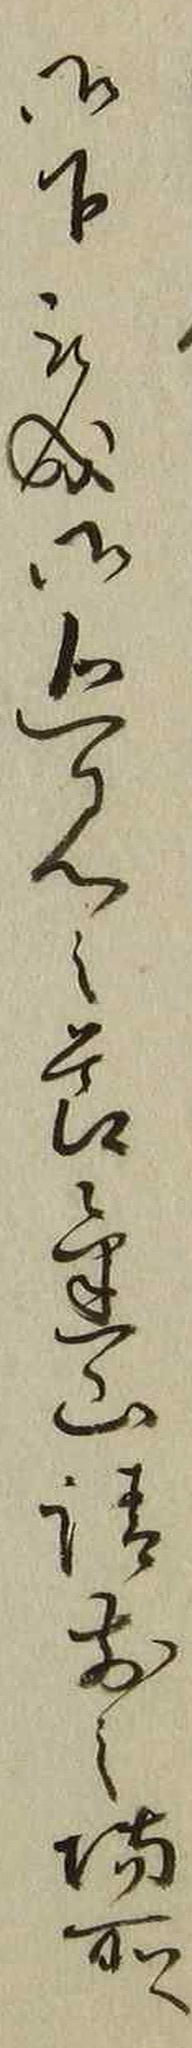御下被成御巡見之節金山請前之場所へ
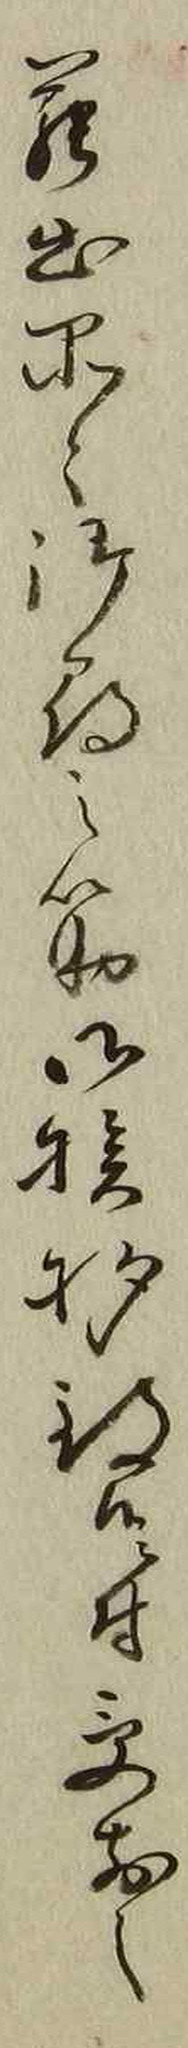罷出品々御尋之筋御挨拶致候ニ付受前之
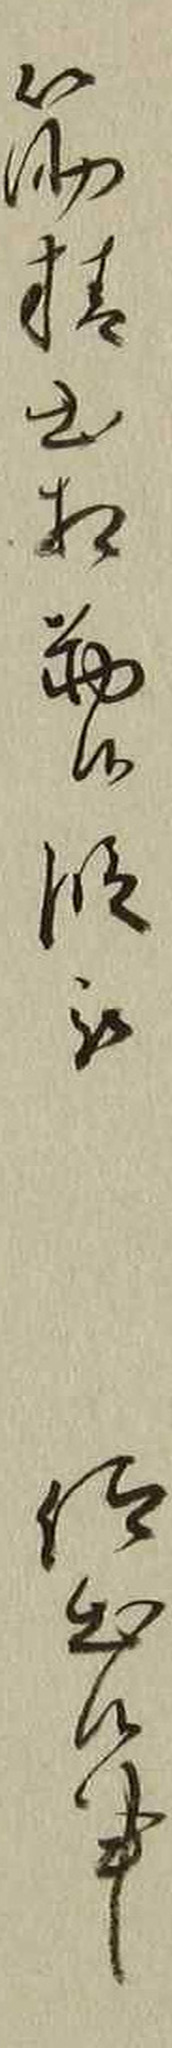筋精出相勤候段被仰出候事
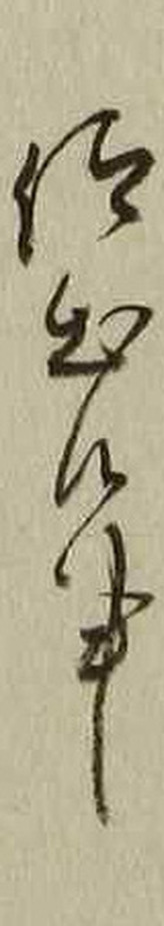仰付候事
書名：諸士系譜　巻之4　い之部4
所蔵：会津若松市立会津図書館
